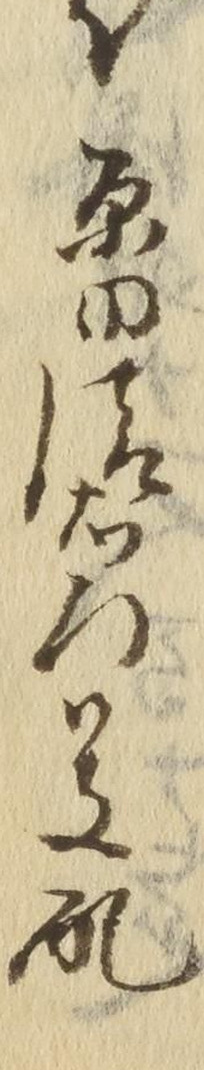原田清右衛門御支配
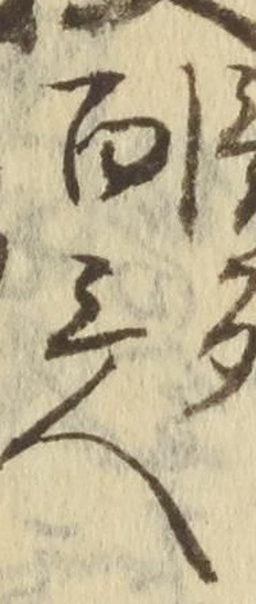百三人
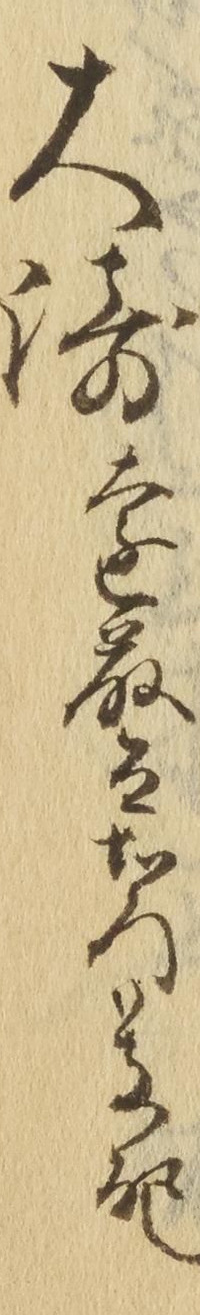大嶋遠藤兵右衛門御支配

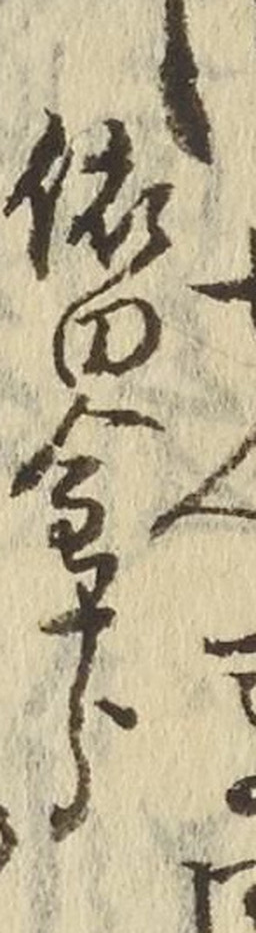依田金十郎
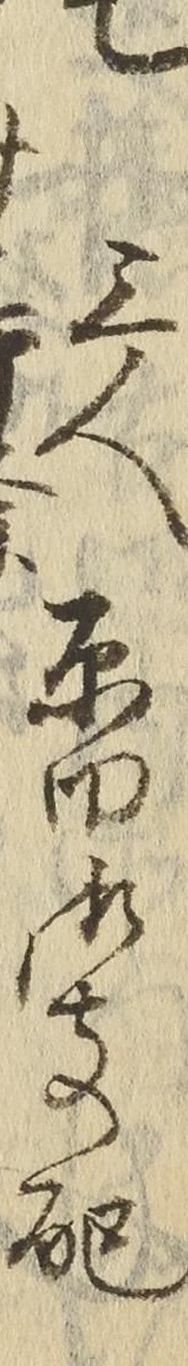三人原田御支配
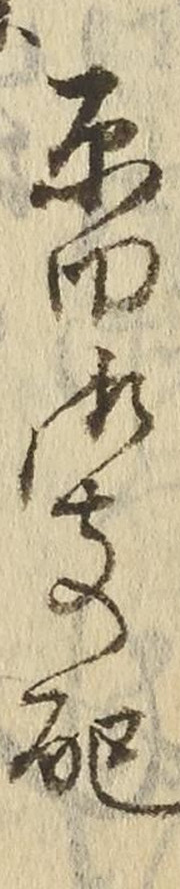原田御支配
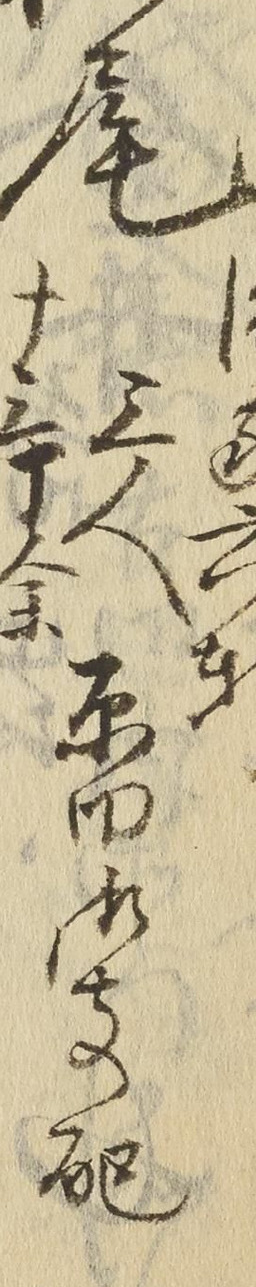三人原田御支配
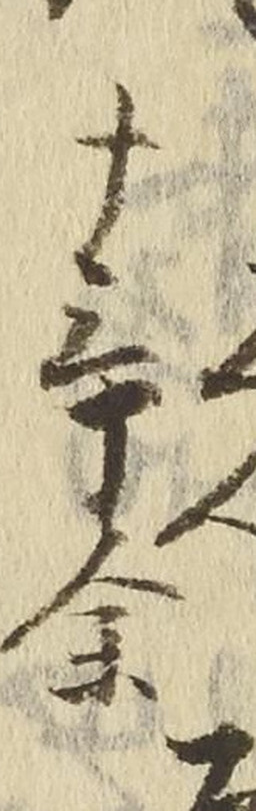十三丁余
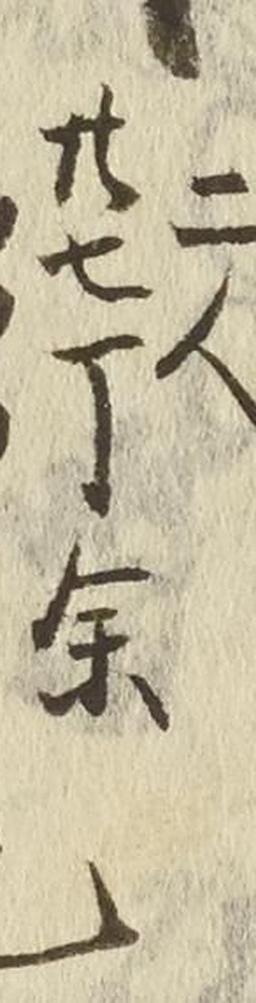廿七丁余
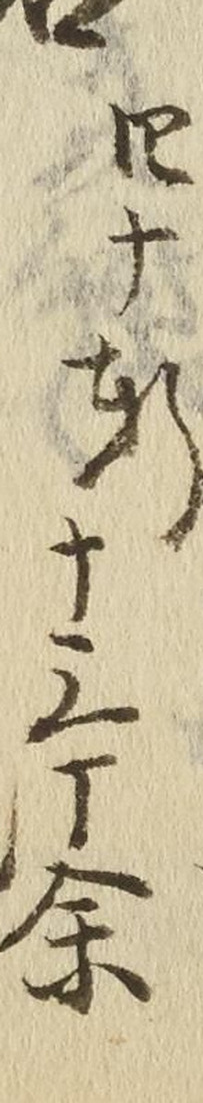四十軒十三丁余
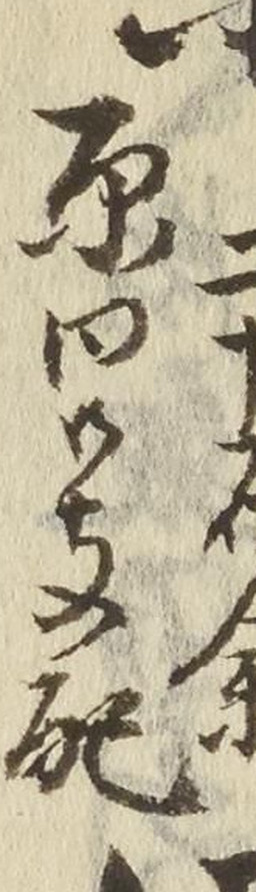原田御支配
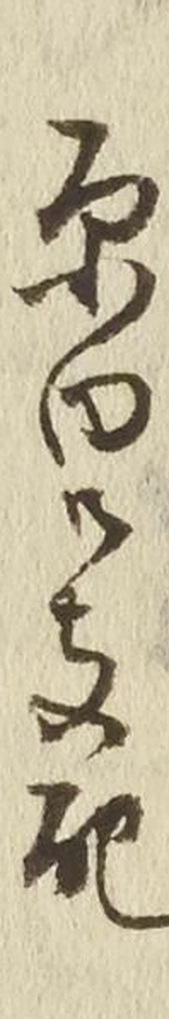原田御支配
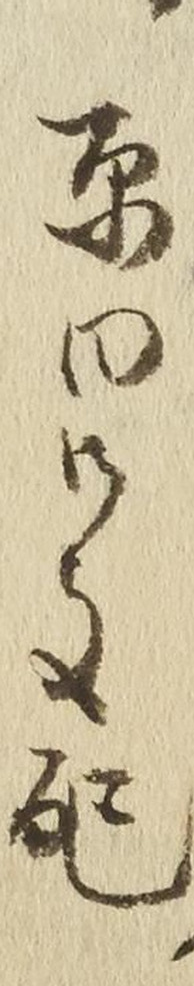原田御支配
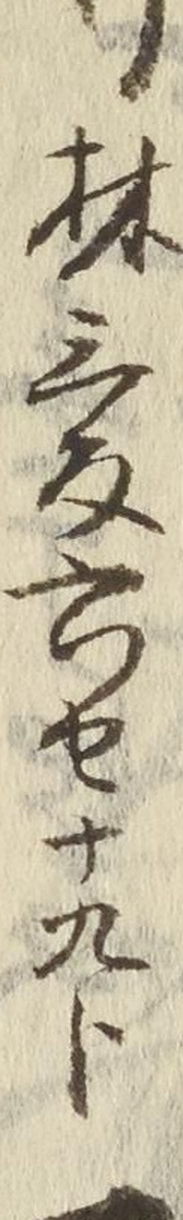林三反六せ十九部
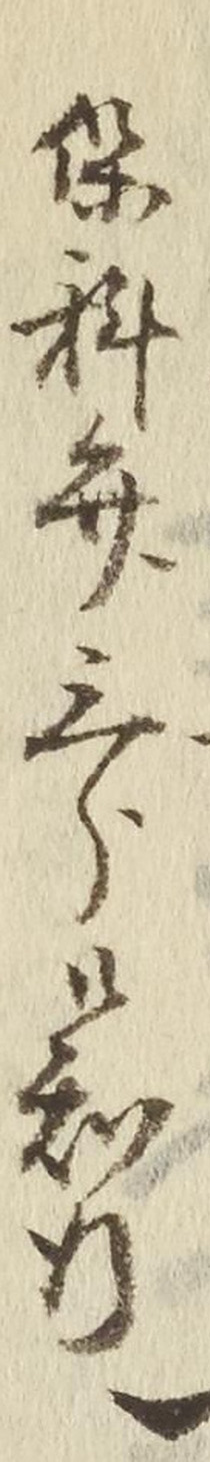保科弁三郎御知行
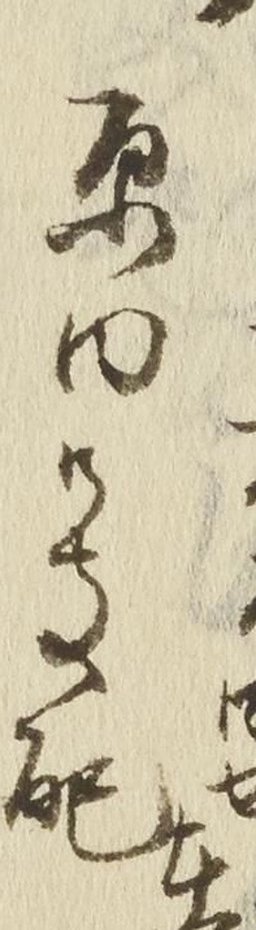原田御支配
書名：浅間大變記
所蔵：東京大学地震研究所図書室 Earthquake Research Institute Library, The University of Tokyo, JAPAN
